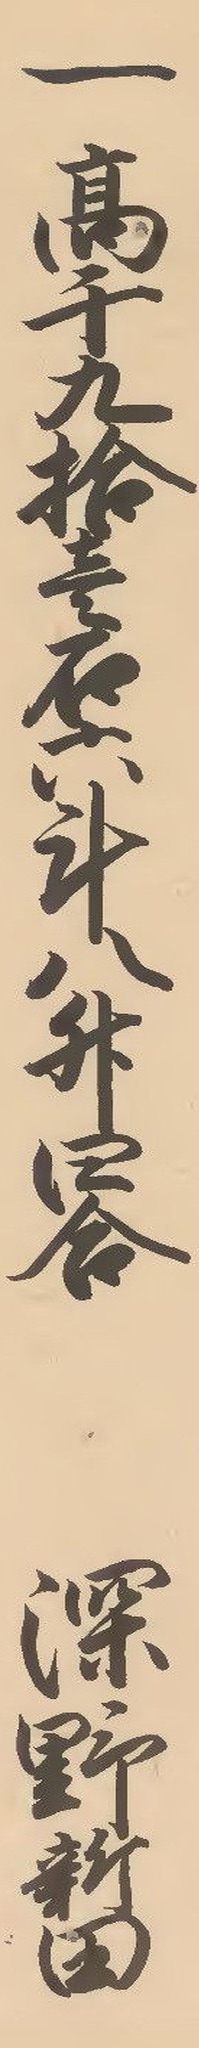一高千九拾壱石六斗八升四合深野新田
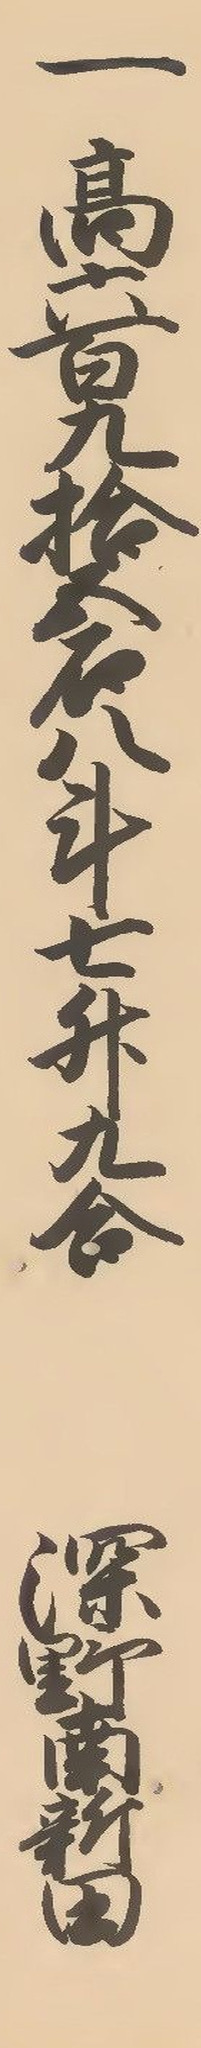一高六百九拾五石八斗七升九合深野南新田
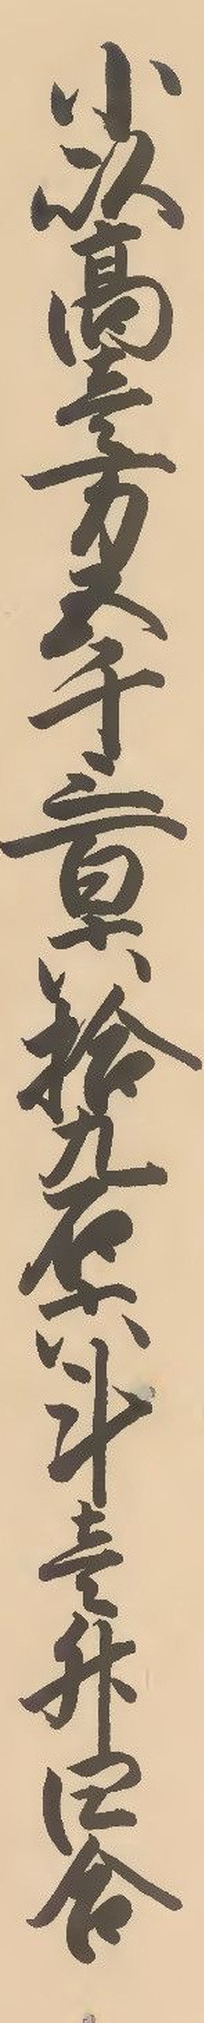小以高壱万五千三百六拾九石六斗壱升四合

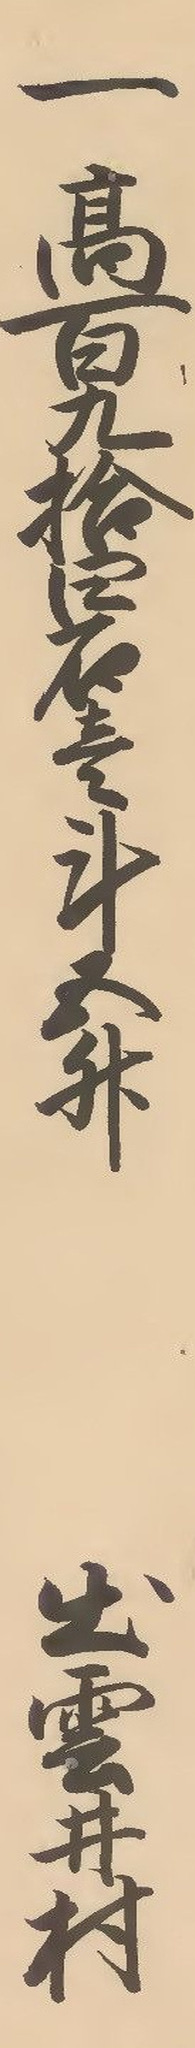一高百九拾四石壱斗五升出雲井村
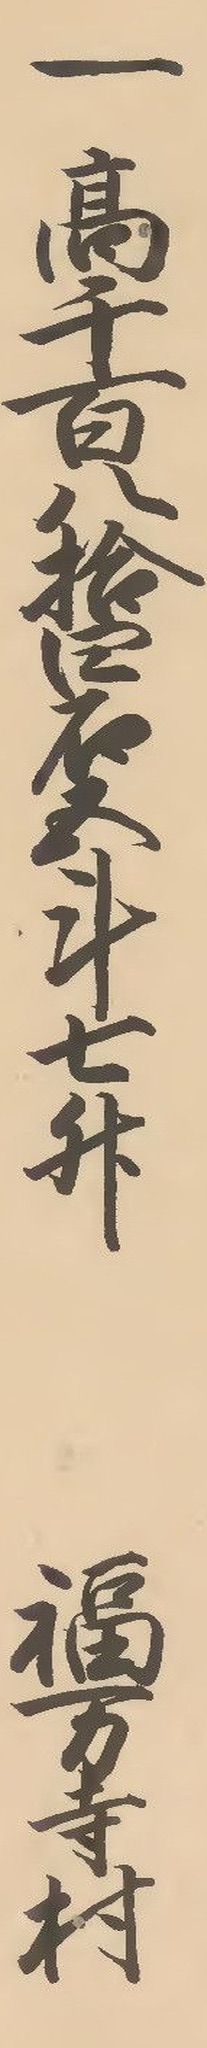一高千百八拾四石五斗七升福万寺村
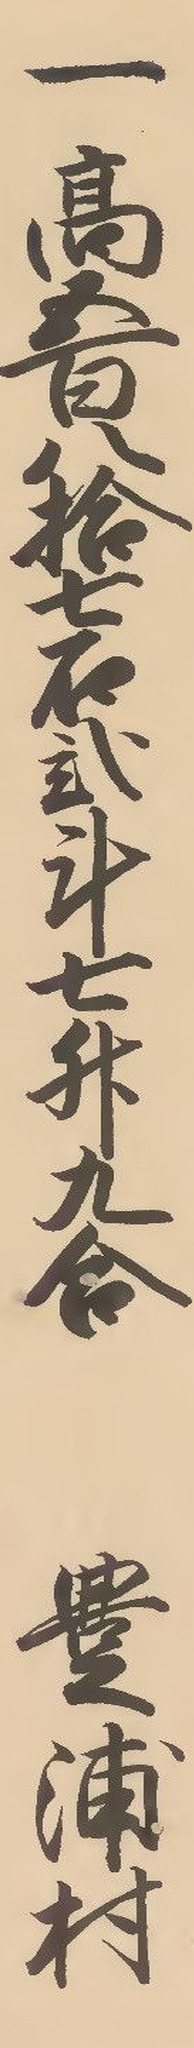一高五百八拾七石弐斗七升九合豊浦村
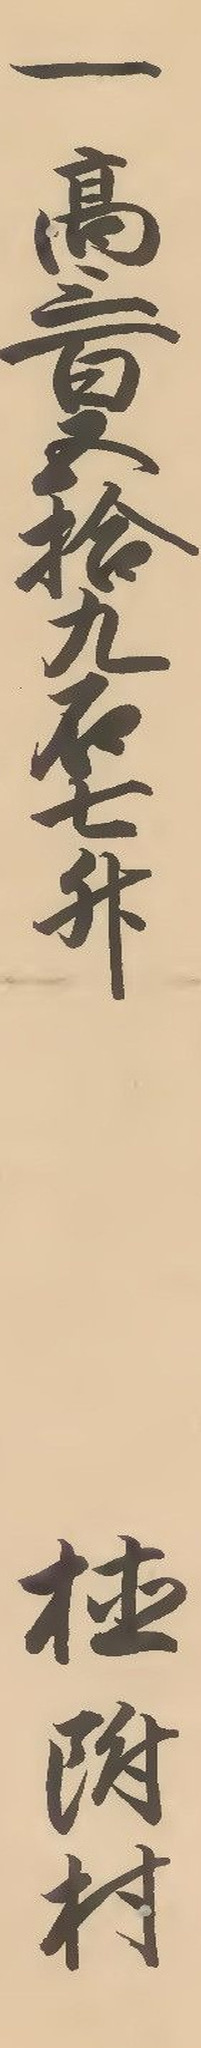一高三百五拾九石七升植附村
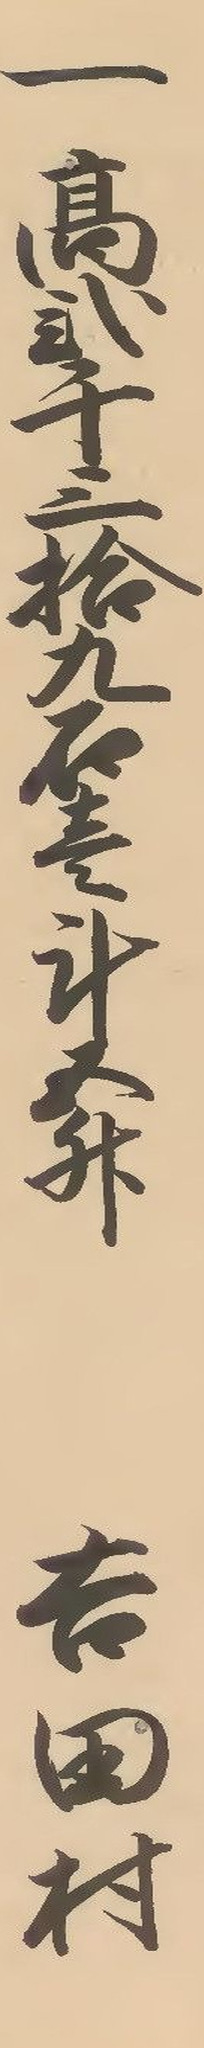一高弐千三拾九石壱斗五升吉田村
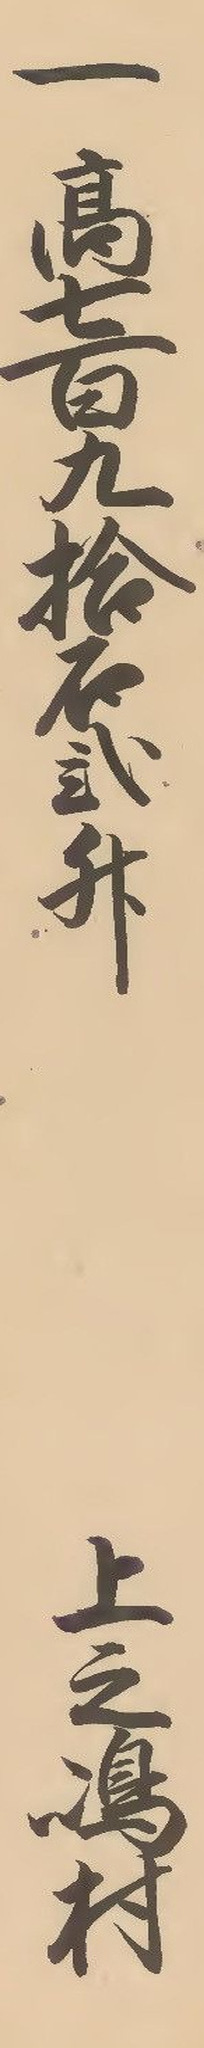一高七百九拾石弐升上之島村

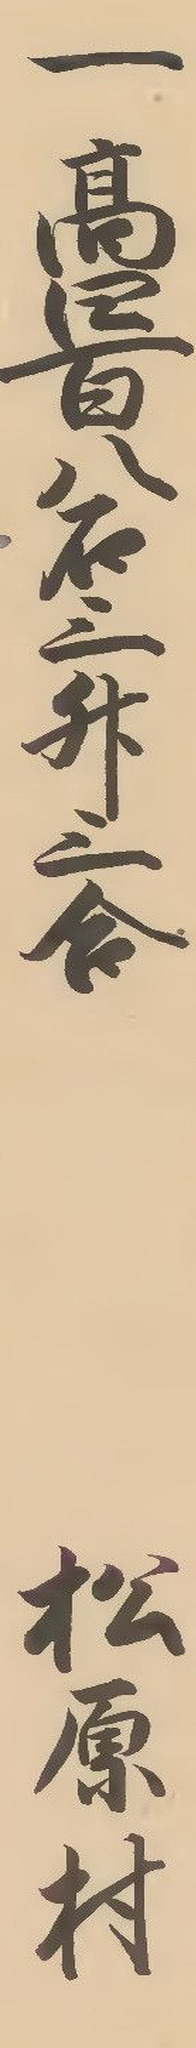一高四百八石三升三合松原村
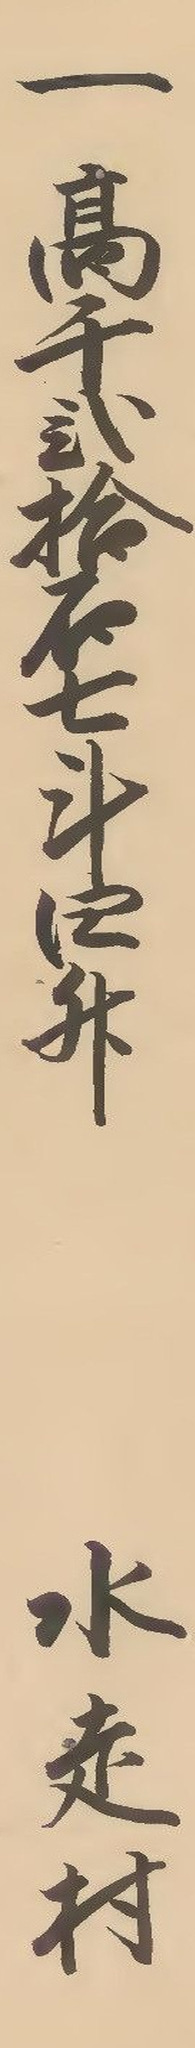一高千弐拾石七斗四升水走村
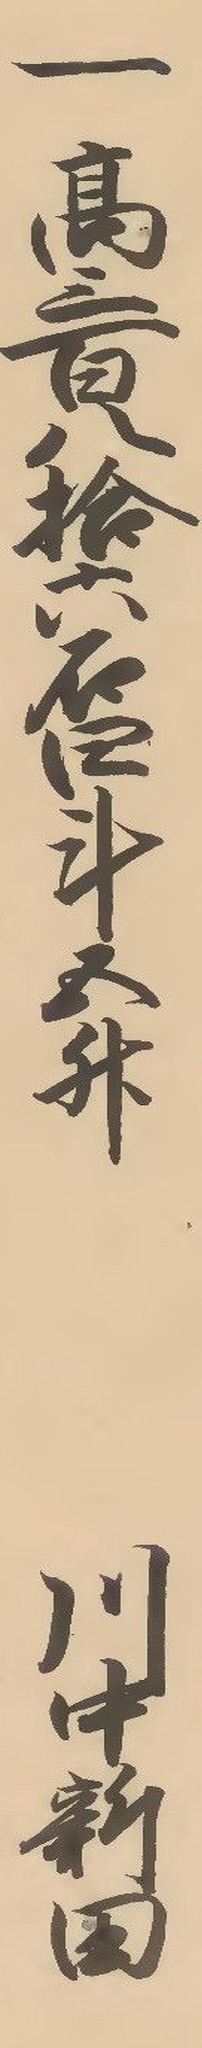一高三百八拾六石四斗五升川中新田
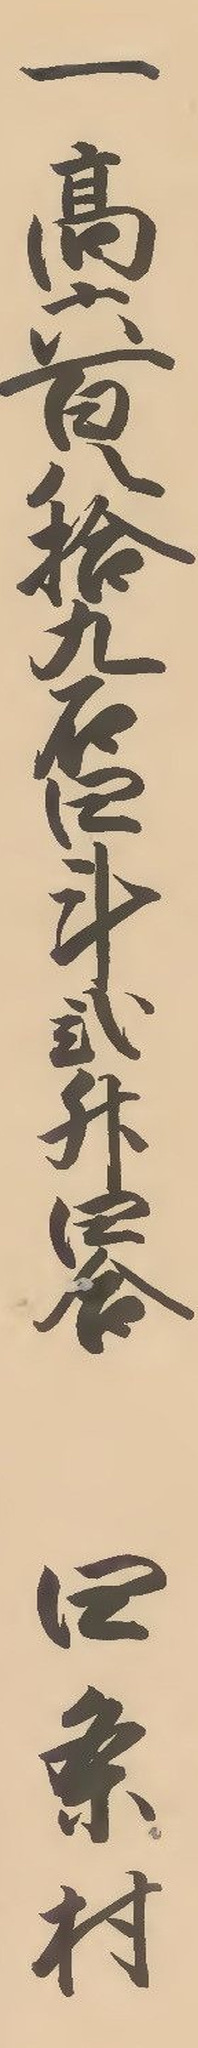一高六百八拾九石四斗弐升四合四条村
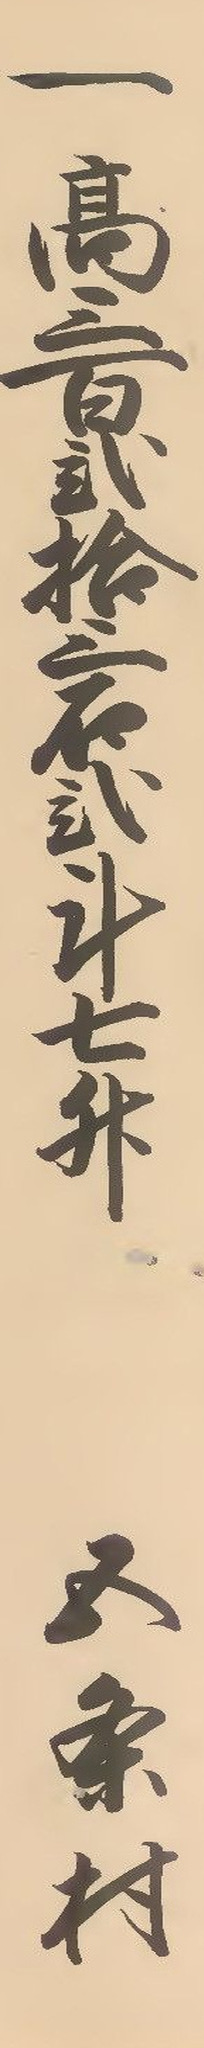一高三百弐拾三石弐斗七升五条村
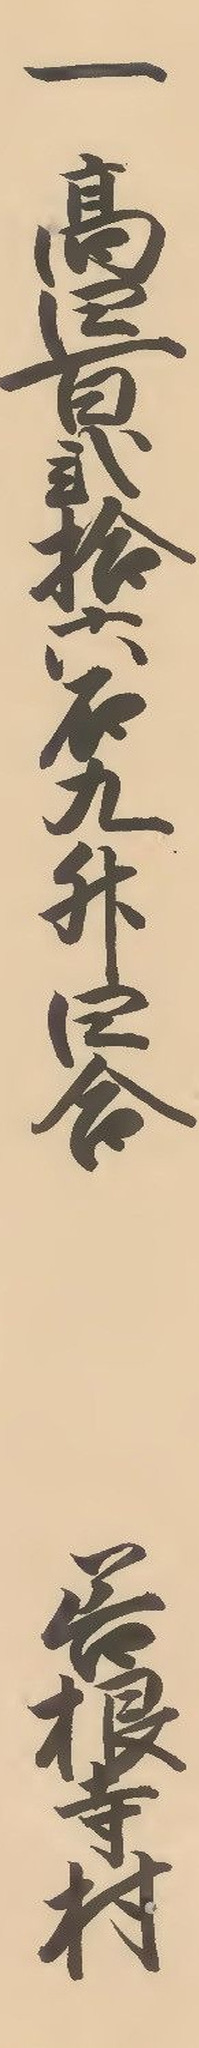一高四百弐拾六石九升四合善根寺村
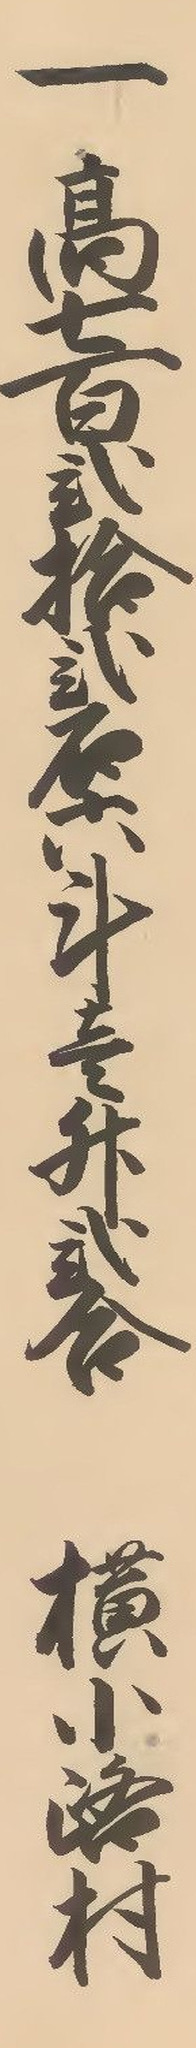一高七百弐拾弐石六斗壱升弐合横小路村
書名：河内国郷帳
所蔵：国立公文書館 National Archives of Japan
